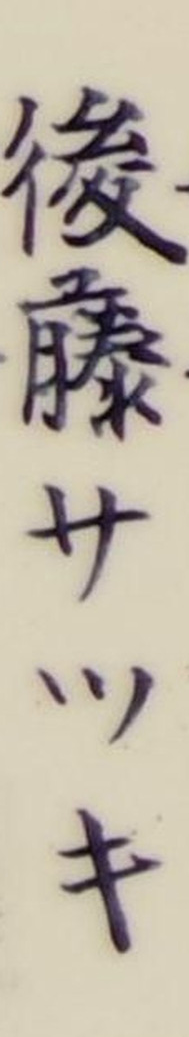後藤サツキ
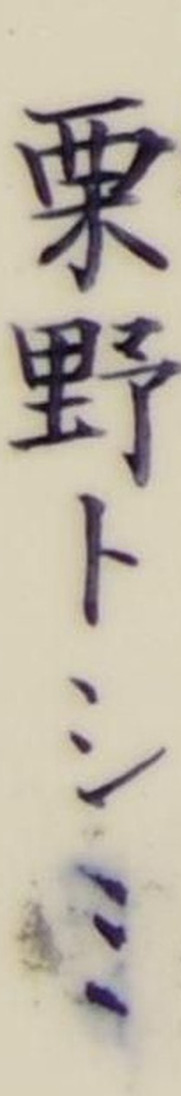栗野トシミ

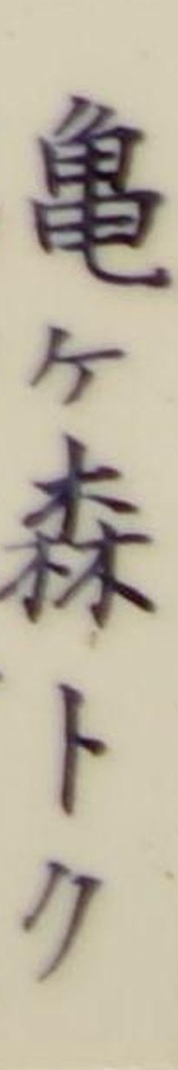亀ケ森トク
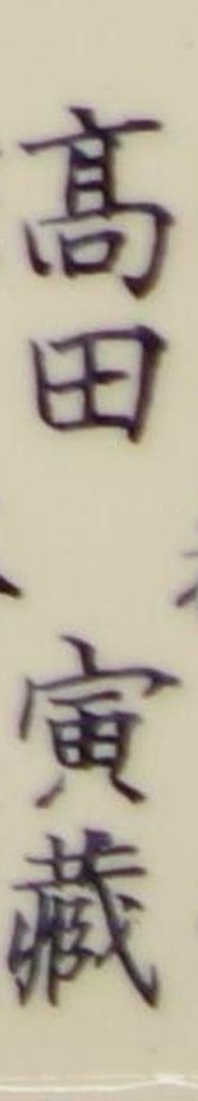高田寅蔵
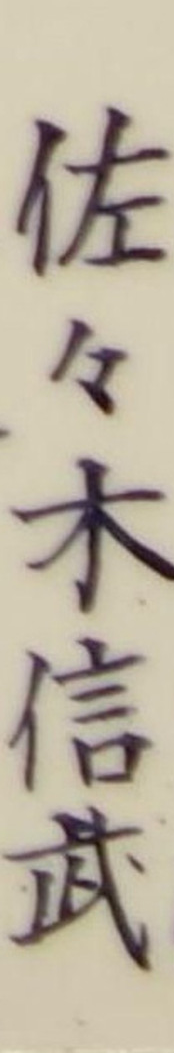佐々木信武
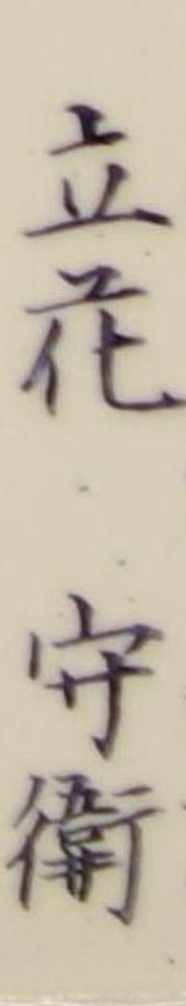立花守衛
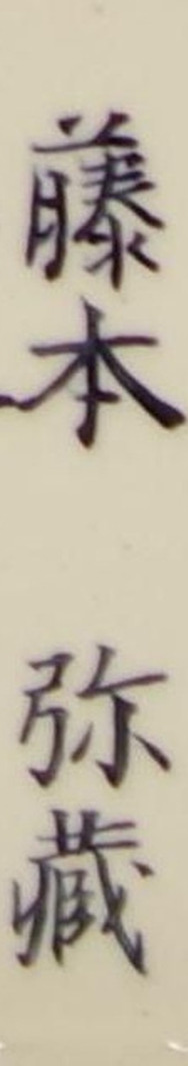藤本弥蔵
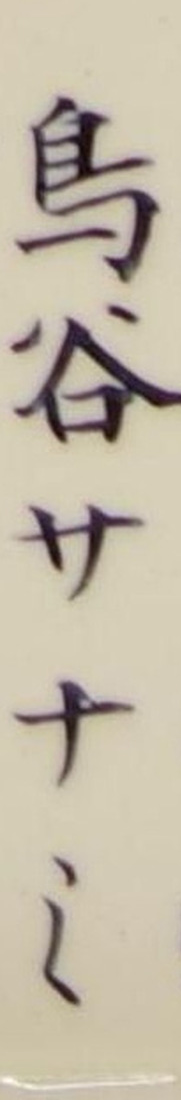鳥谷サナミ
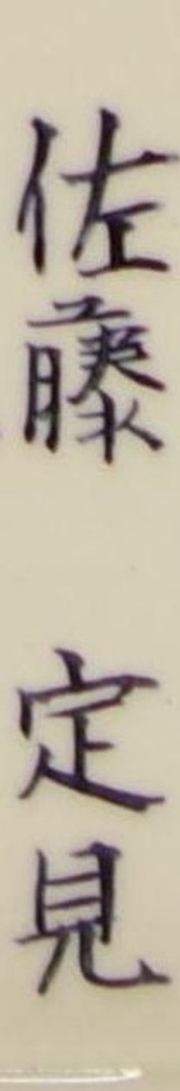佐藤定見
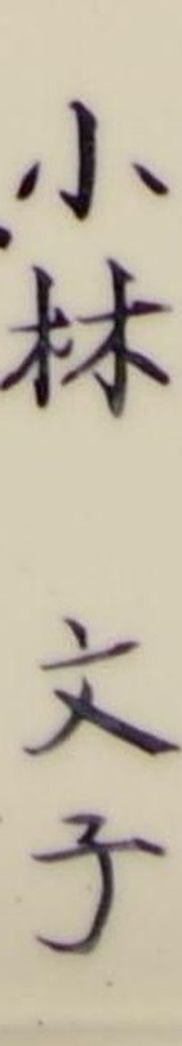小林文子
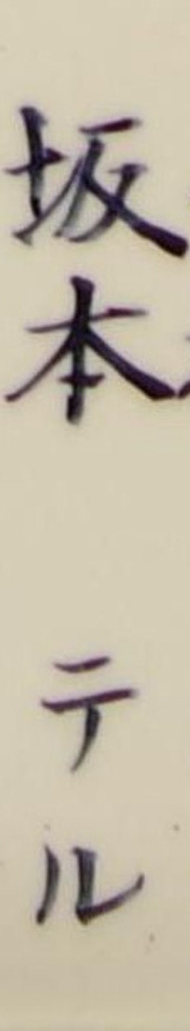坂本テル
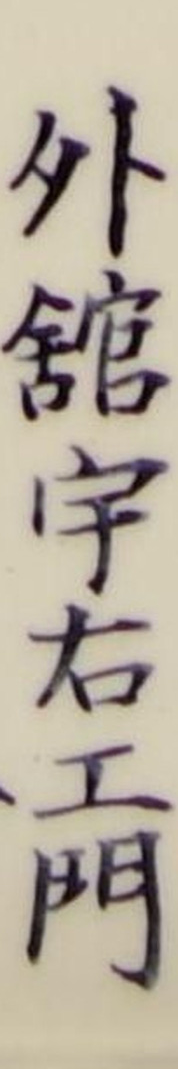外館宇右エ門
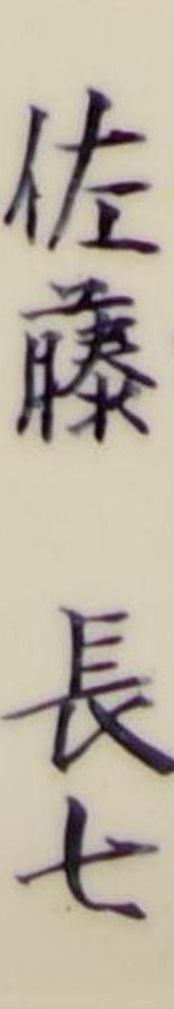佐藤長七
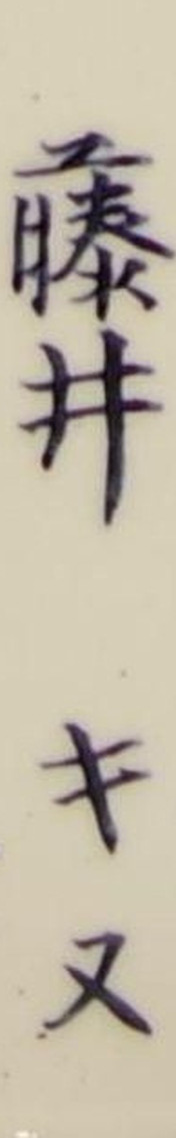藤井キヌ
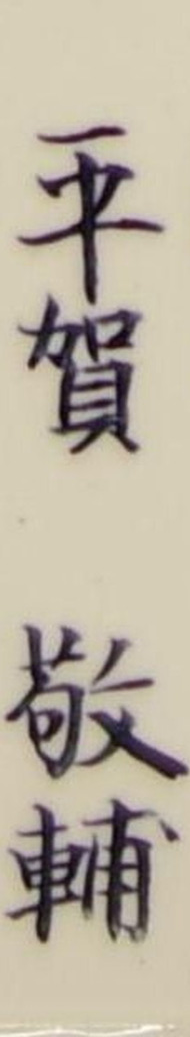平賀敬輔
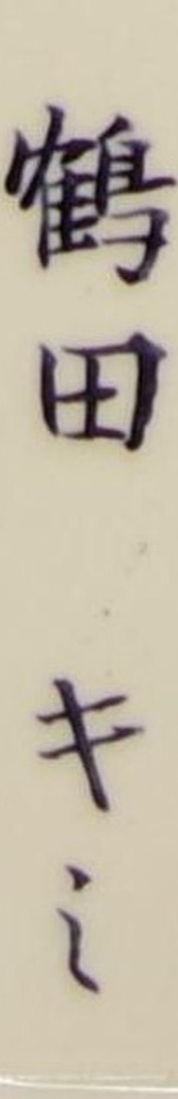鶴田キミ
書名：A~D
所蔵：koyasan kongobuji
